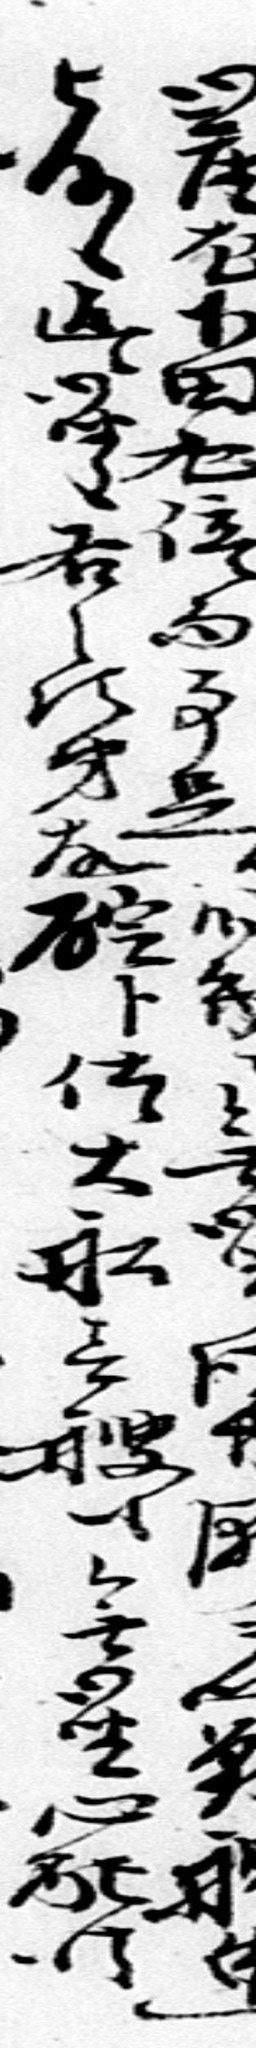被存候迄に御座候右之次第故聢と仕候大船壱艘も無御座心配仕候
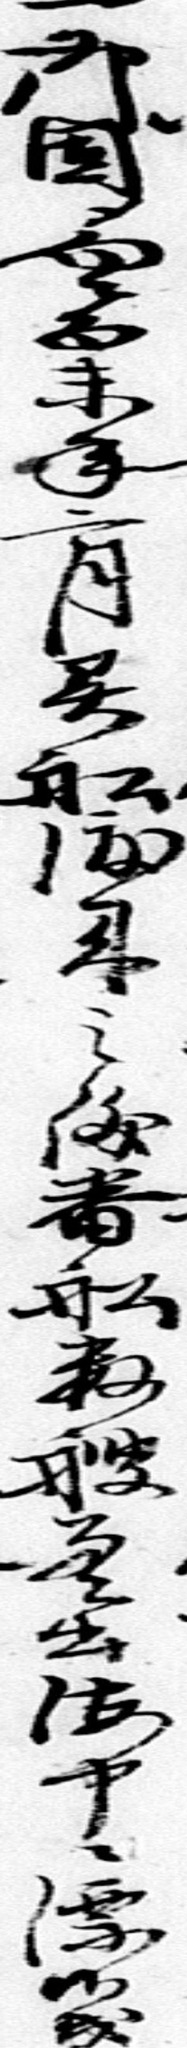一御固め向に而未年二月異国船渡来之儀番船数艘差出海中に漂候義
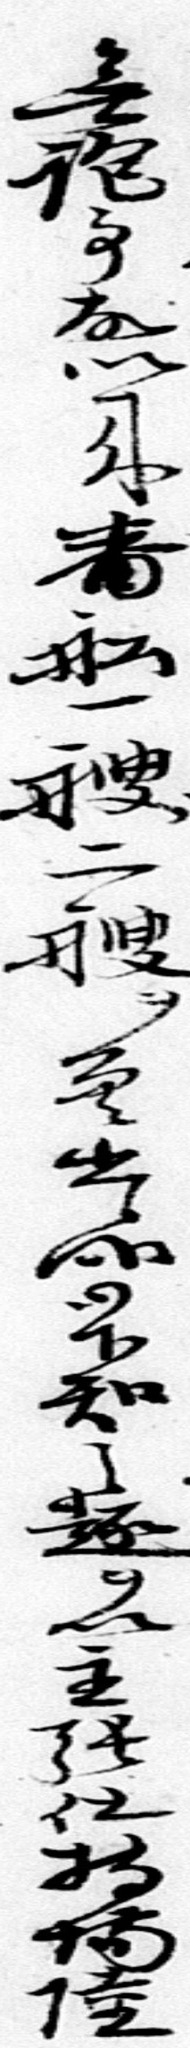無砲事故以来番船一艘二艘を差出候様御下知之趣を以主張仕持場陸
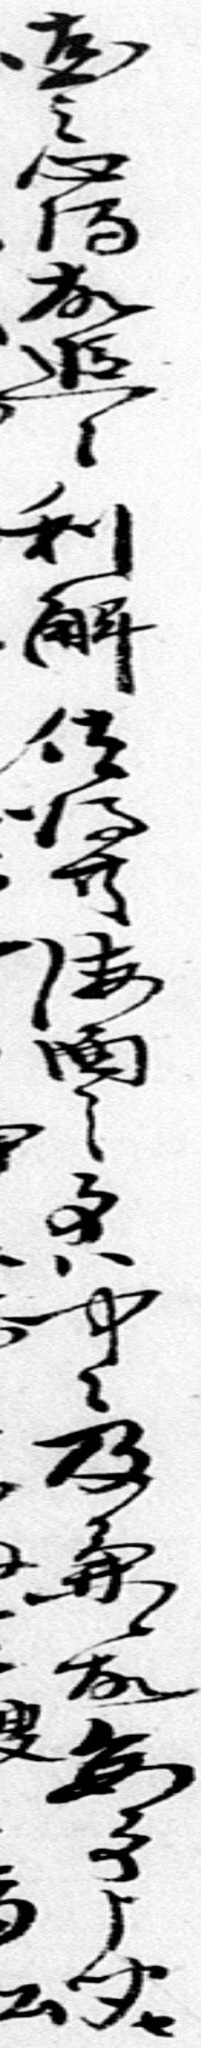固之心得故追々利解仕候得共海面之事は中々及兼候故毎事申聞せ
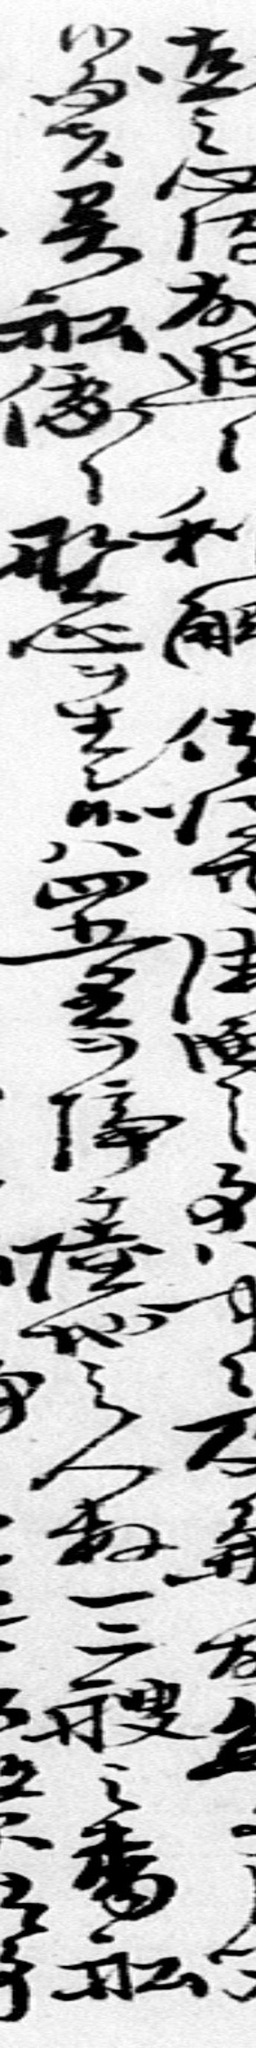候而は異船俄に野心を生し候は四五里を隔て陸地之人数一二艘之番船
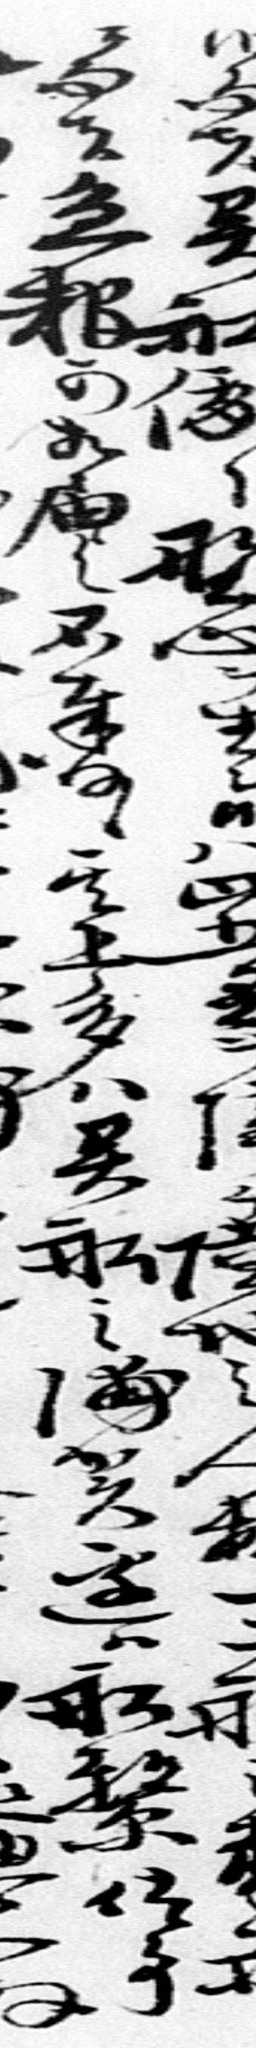に而は急報可相届と不奉存其上多は異船之浦賀辺は船繁仕候事
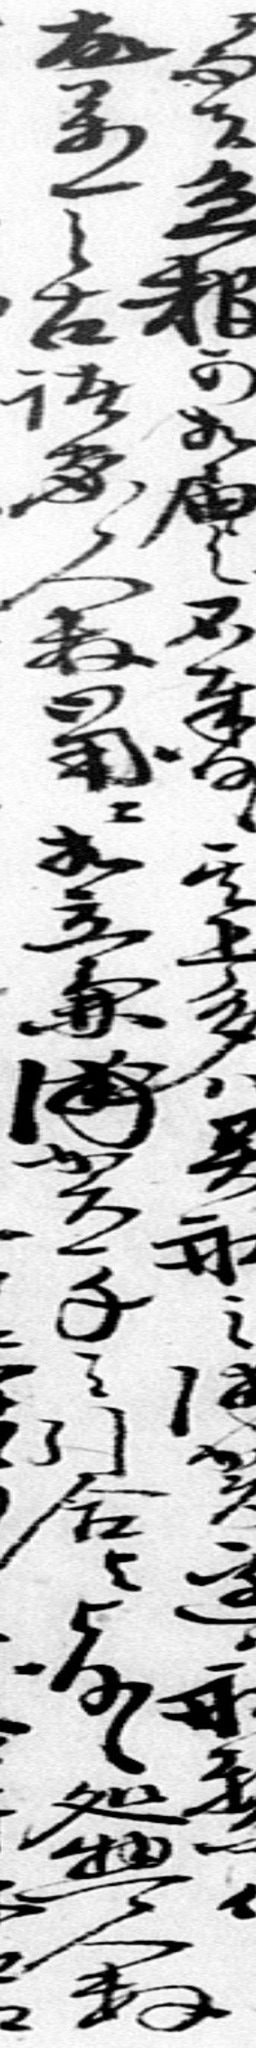故万一之節諸家人数御用に相立兼浦賀一手之引合と被存候処惣人数
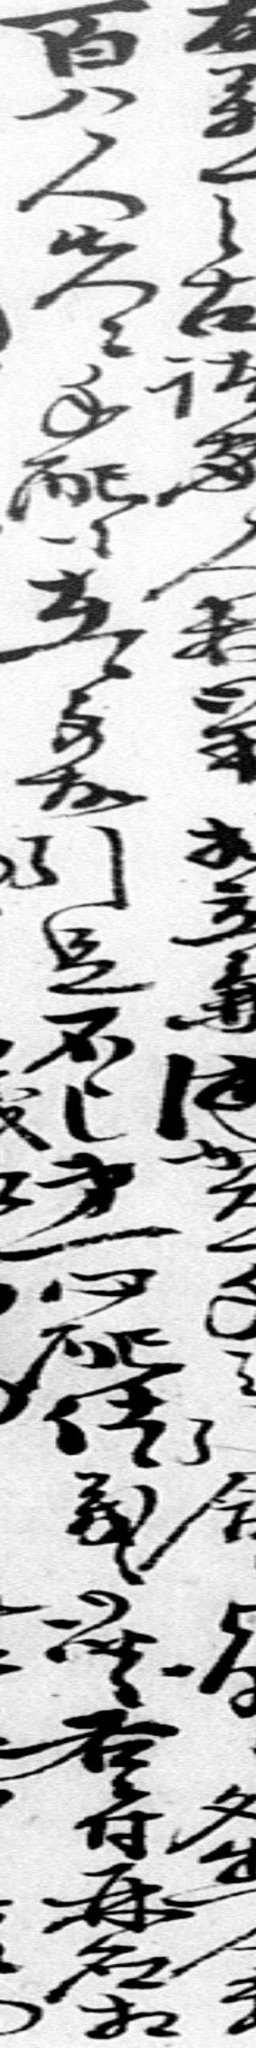百八人先に手配も在候事故引足不申第一心配仕候義に御座候右に付再応相
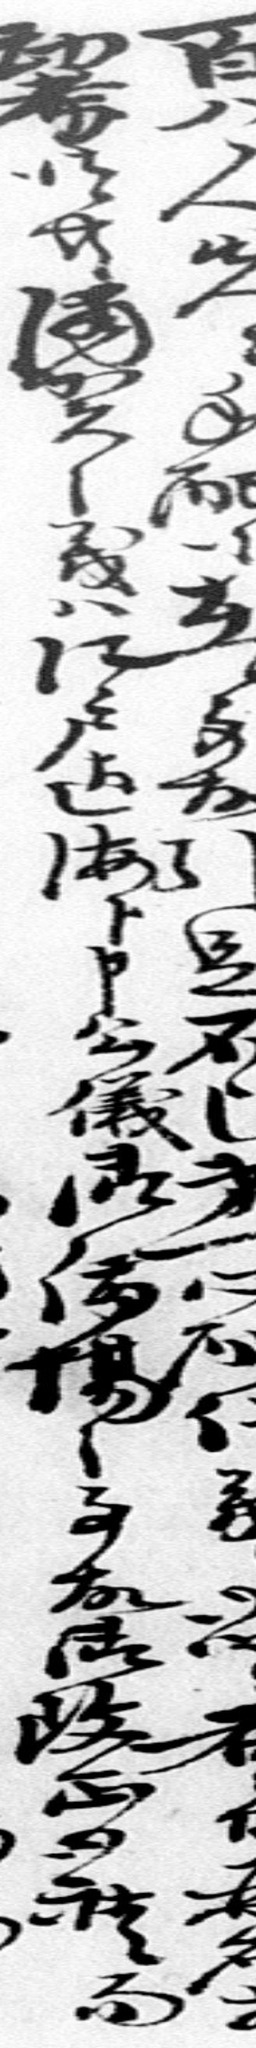勘考仕候共浦賀之義は江戸近海と申公儀御備場之事故御改正御座候而
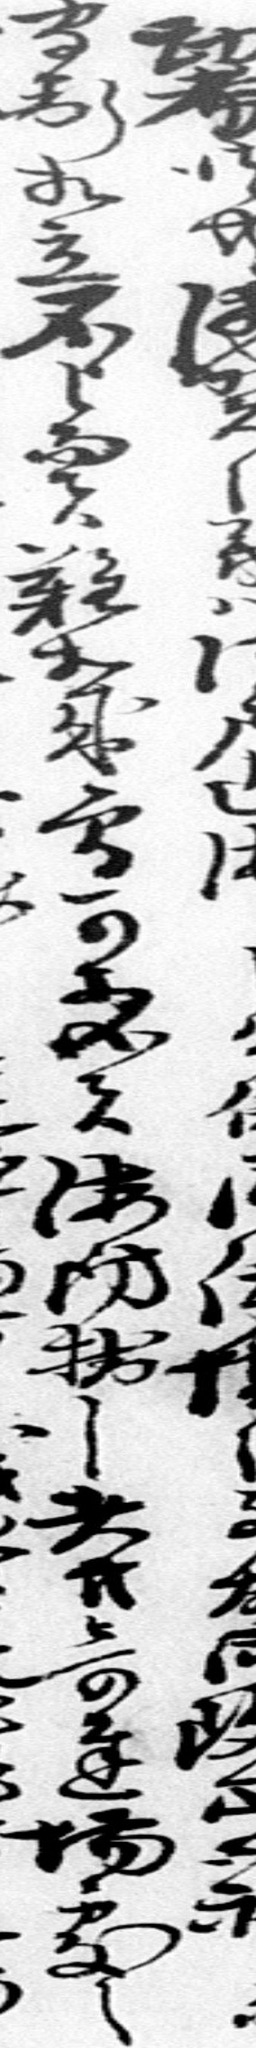守衛相立不申而は難相成専可相成は海防掛之者共江可達場処之
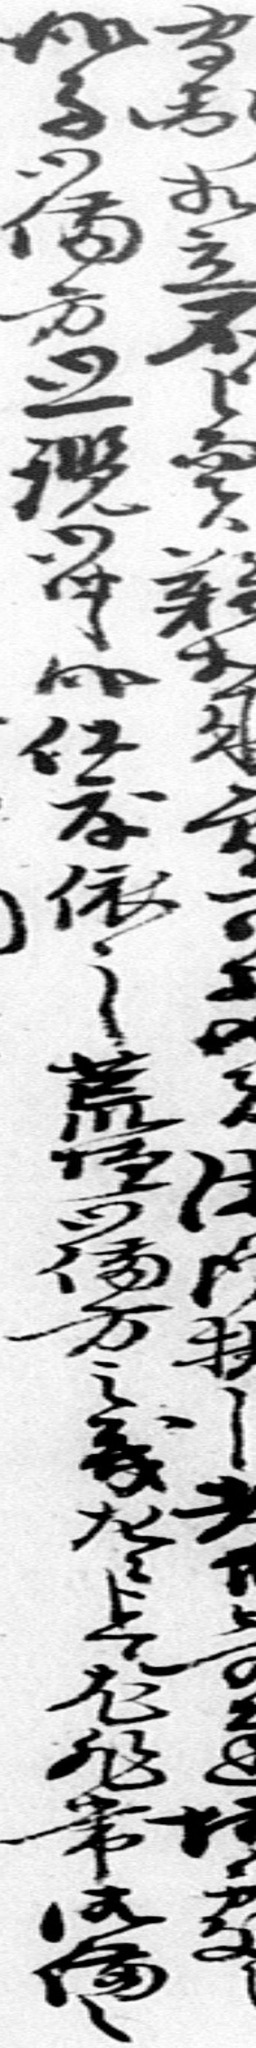様子御備方御一覧御座候様仕度依之荒増御備方之義左に申上候尤非常御備之
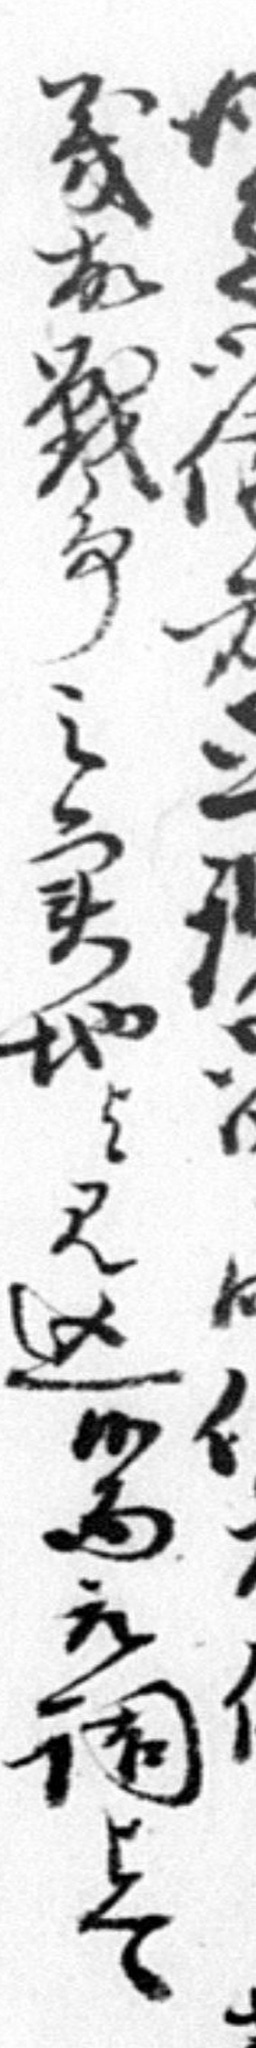義故戦事之実地と見込候而取調申上候
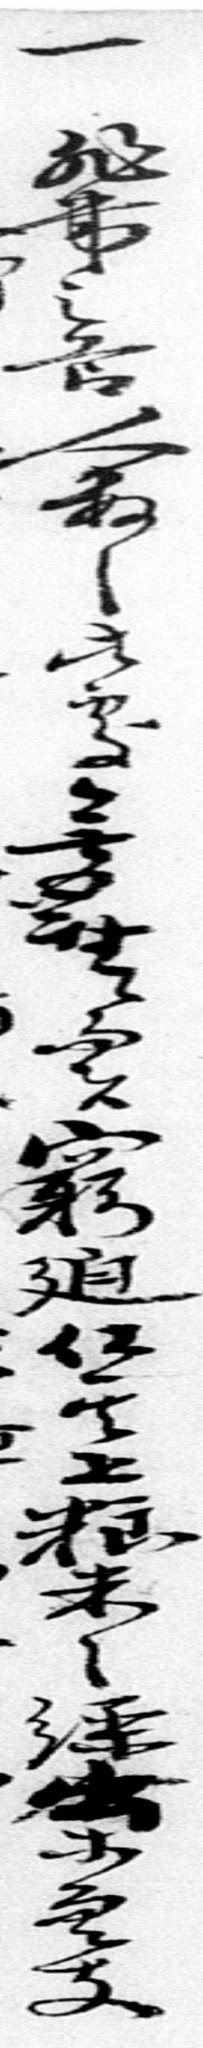一非常之節人数之此処無御座候而は窮迫仕其上粮米之繰出等差支
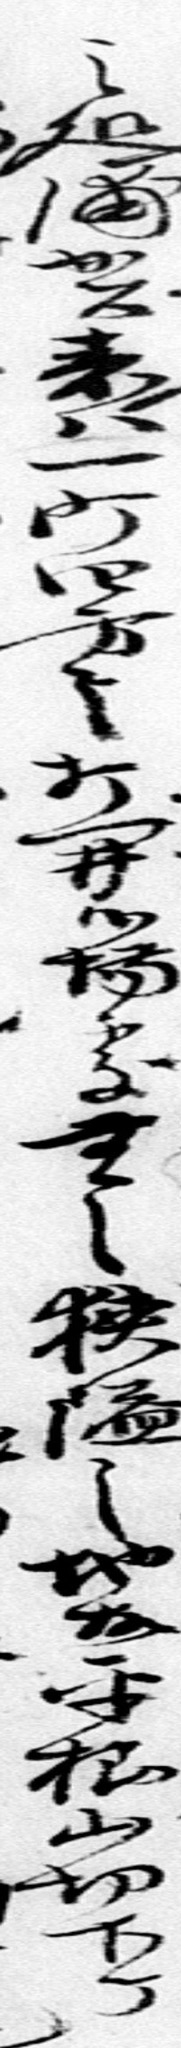之処浦賀表は一町四方と打開候場処無之狭隘之地故平根山切下け
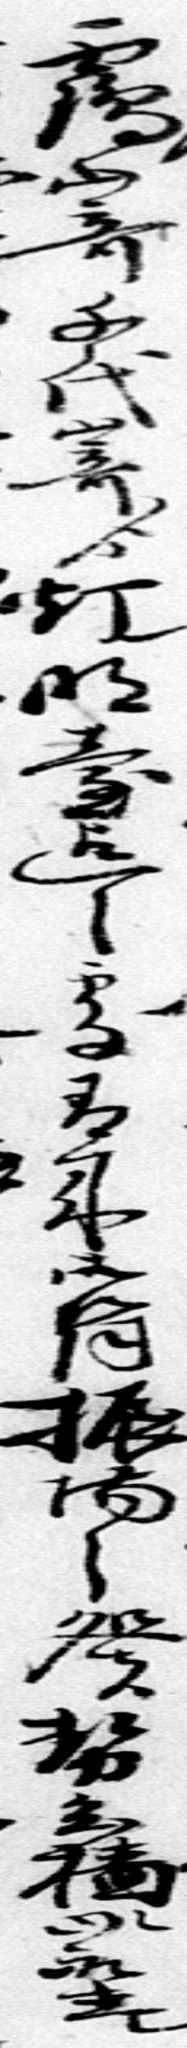鶴崎千代崎ゟ灯明台迄之処有来御筒振場之処は勢急檣に御取直
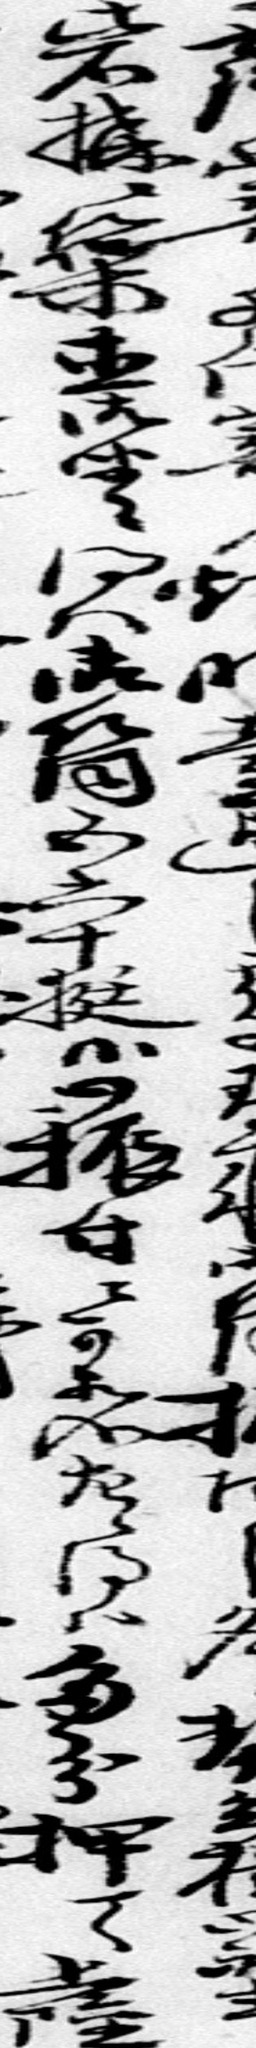砦構に築直御座候得は御筒五六十挺御振付に可相成左候得は多分押て上陸
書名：浦賀御奉行見込秘書写
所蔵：徳島県立図書館
